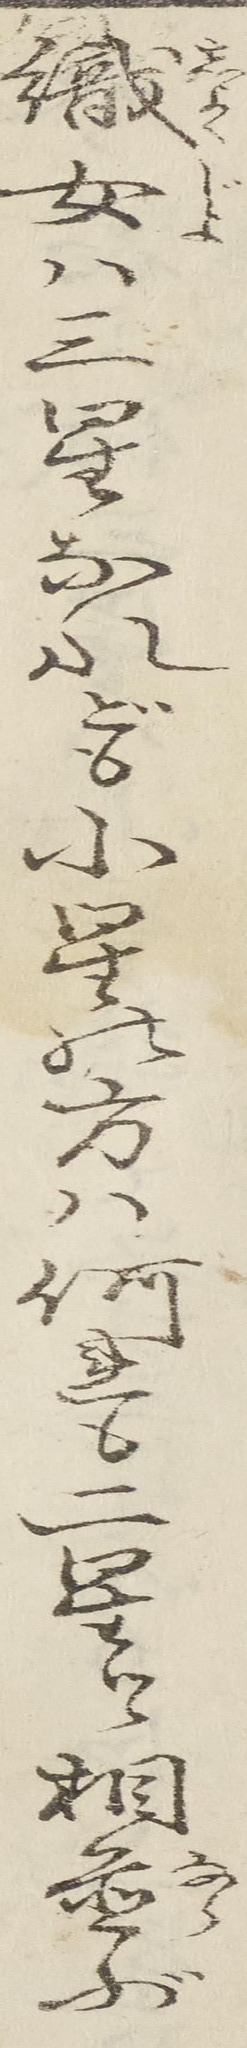織女は三星なれども小星の方は何れも二星ツヽ相並ぶ
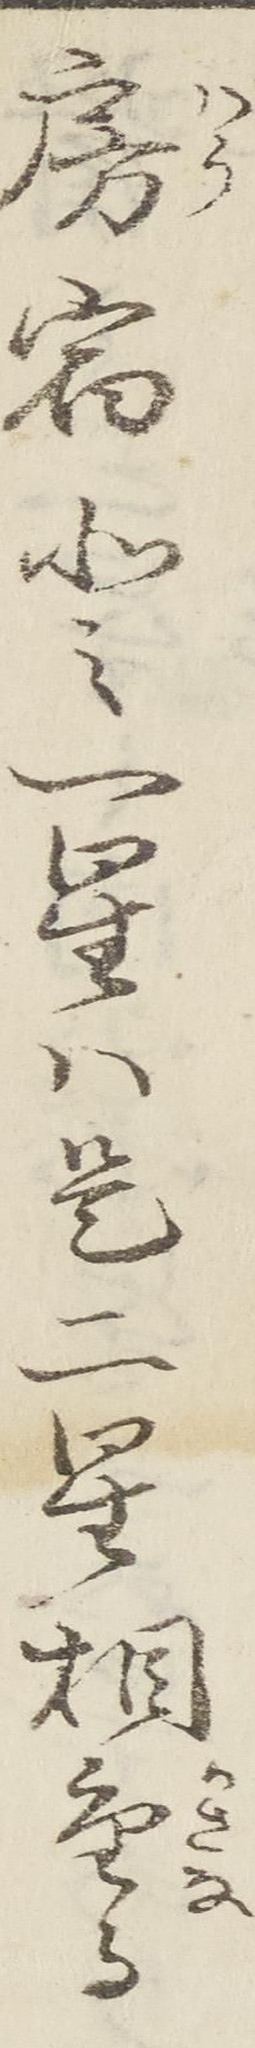房宿北之一星は是二星相重る
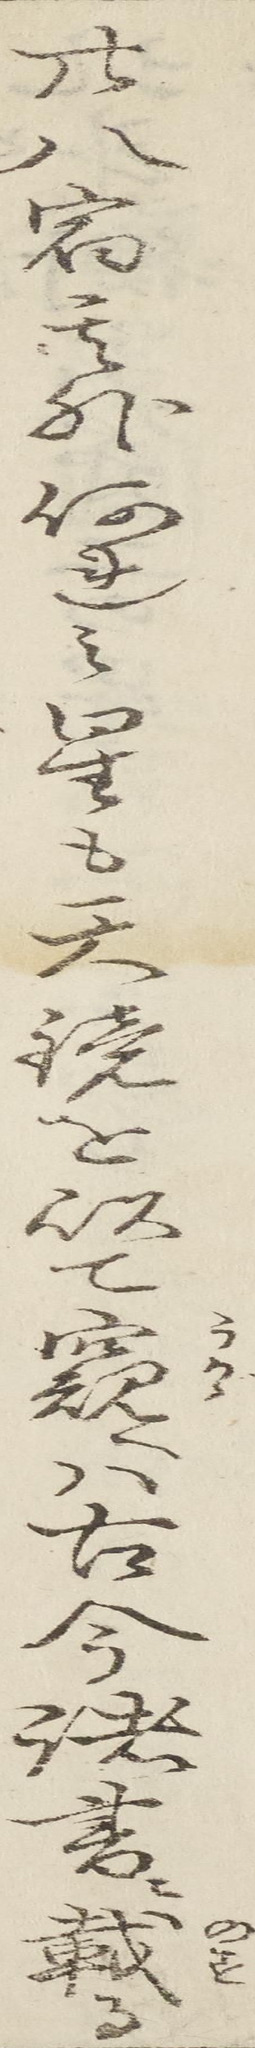廿八宿其外何れ之星も天鏡を以て窺へは古今諸書ニ載る
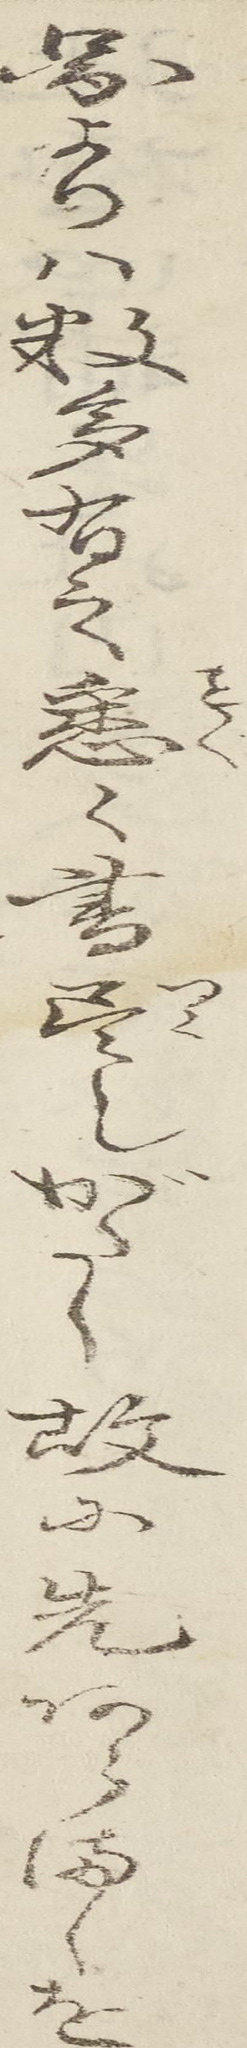図よりは数多有之悉く書尽しがたし故に先あらましを
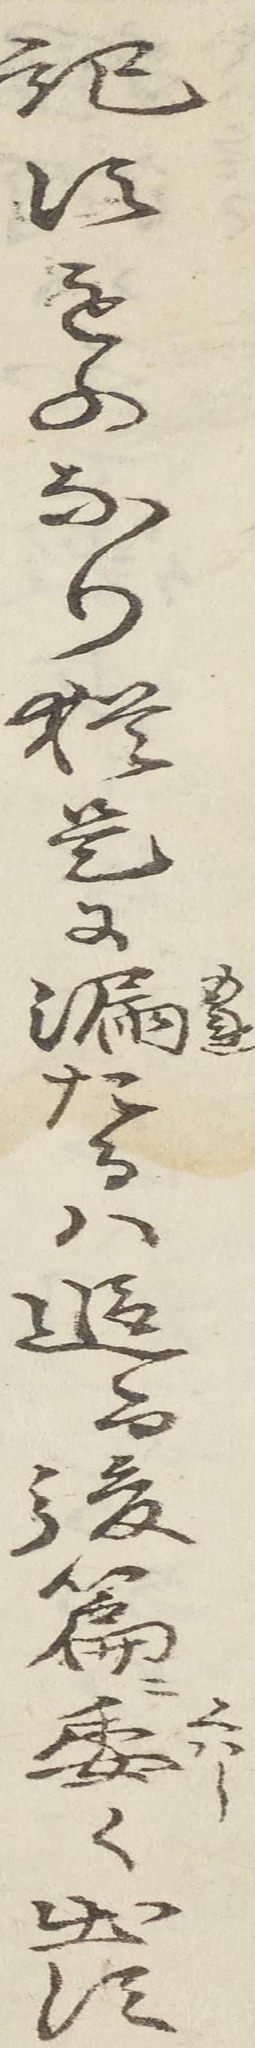記すものなり猶是に漏たるは追而後篇ニ委く出す
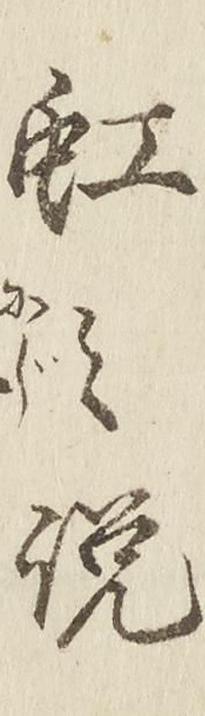虹之説
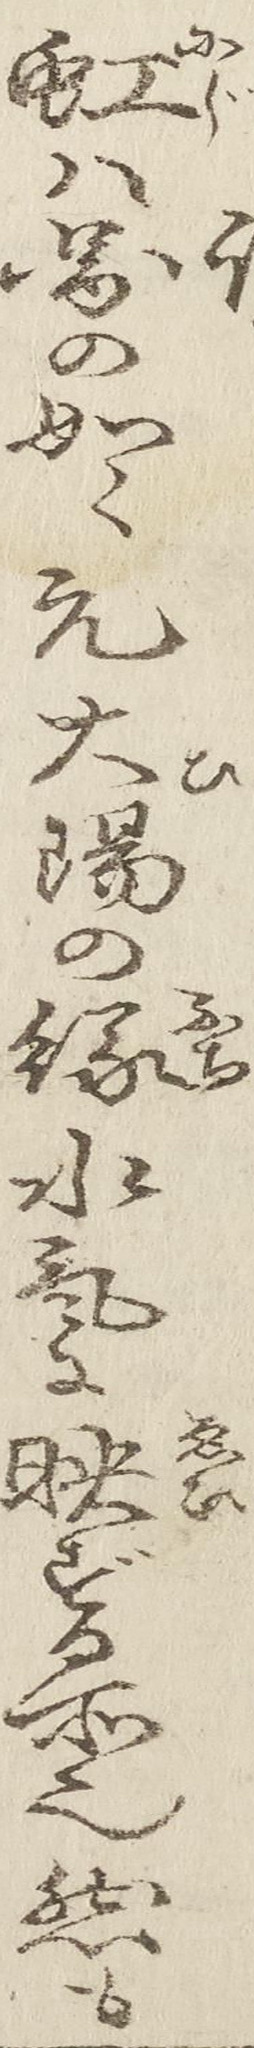虹は図の如く元大陽の縁水気に映ずる所也然も
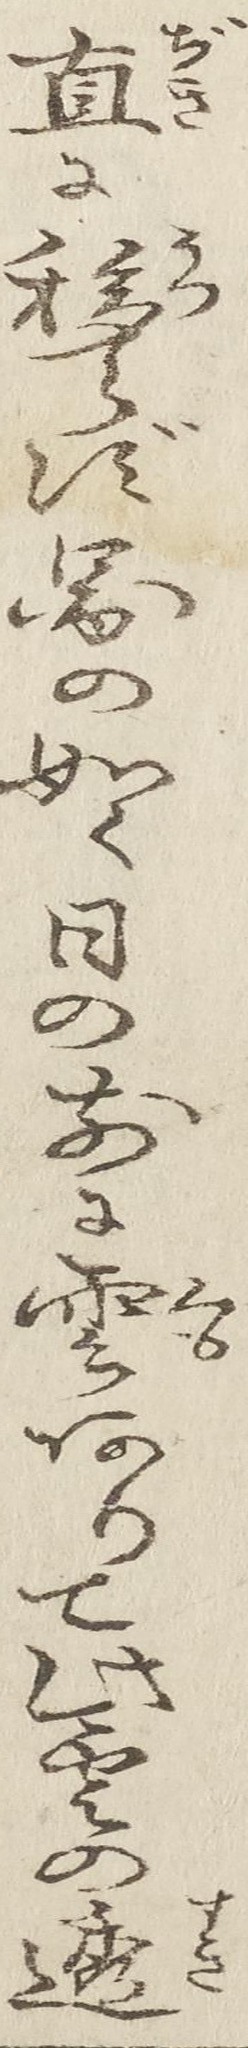直に移らず図の如く日の前に雲ありて此雲の透
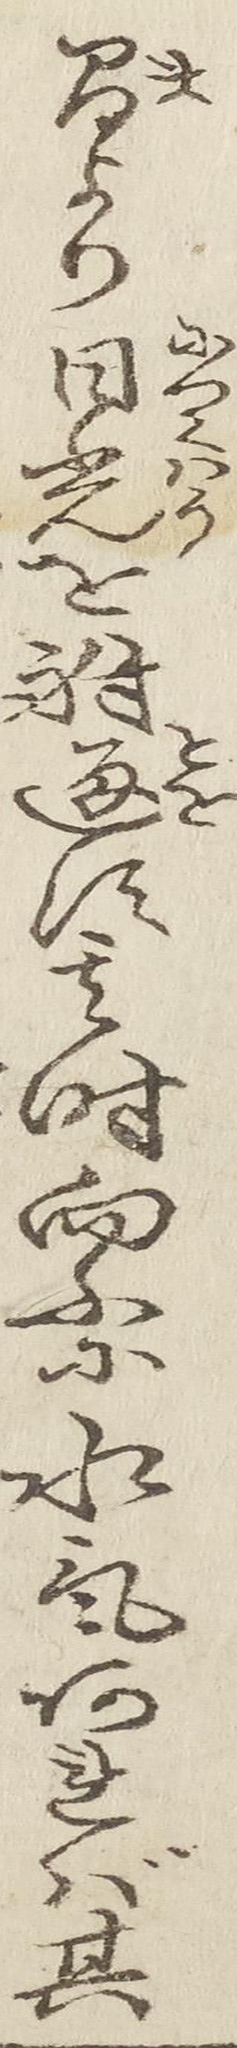間より日光を射通す其時向ふに水気あれば其
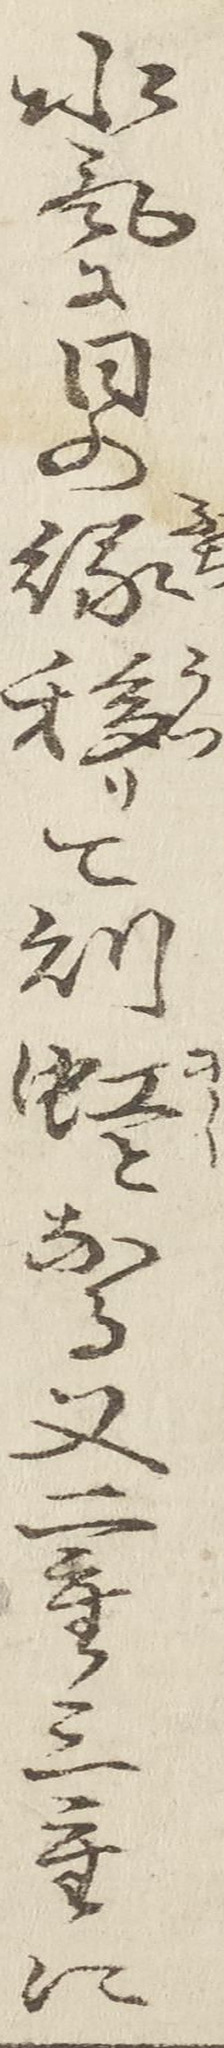水気に日の縁移りて則虹となる又二重三重に
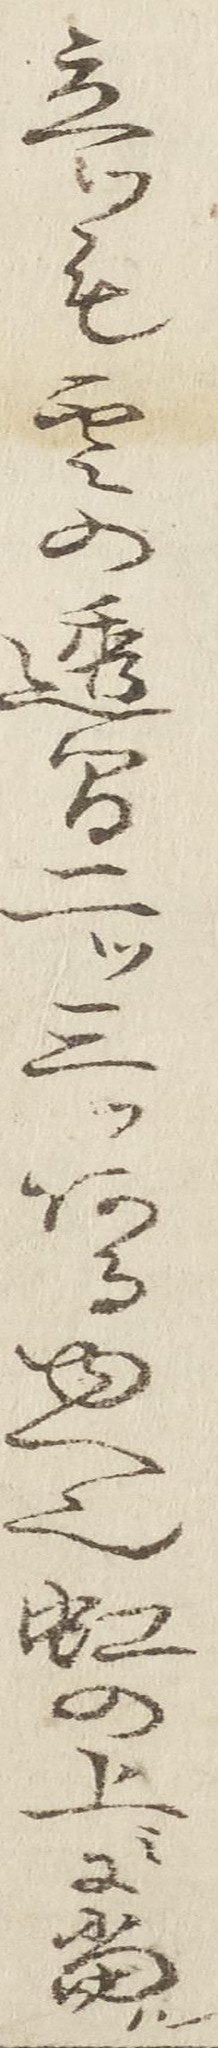立つも雲の透間二ツ三ツあるゆへ也虹の上みに当ル
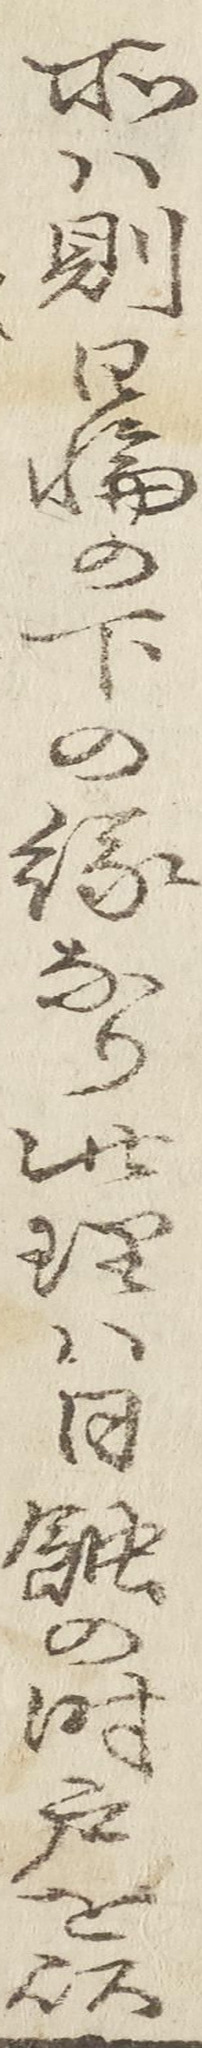所は則日輪の下の縁なり此理は日蝕の時戸を以
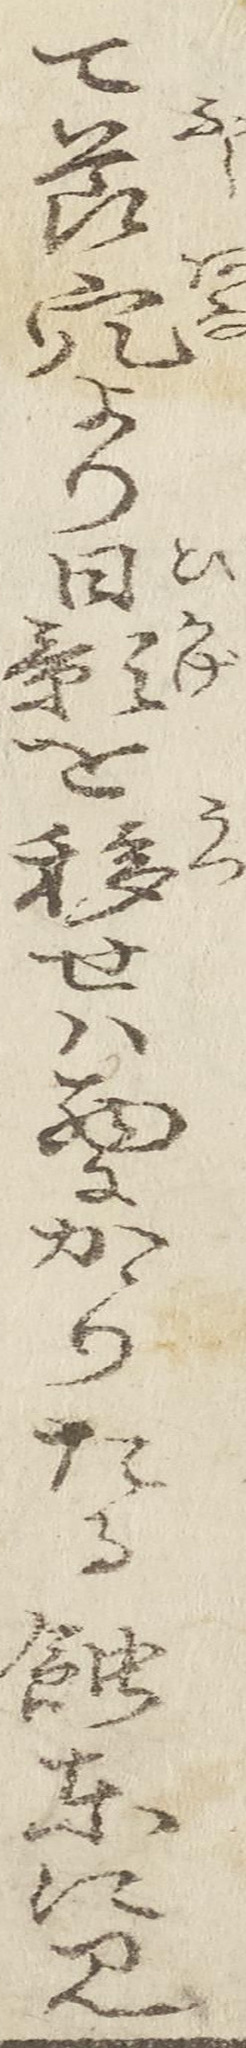て節穴より日陰を移せは西にかゝりたる蝕東に見
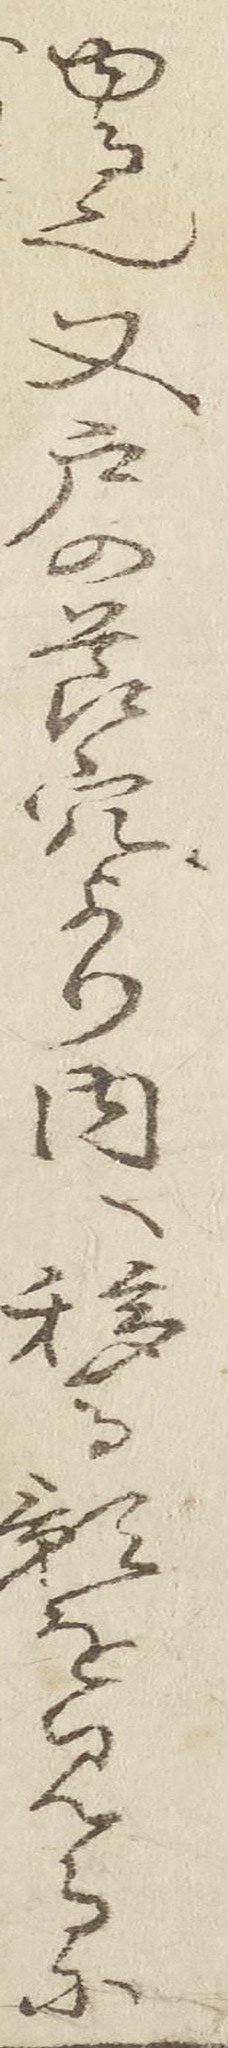ゆる也又戸の節穴より内へ移る影を見るに
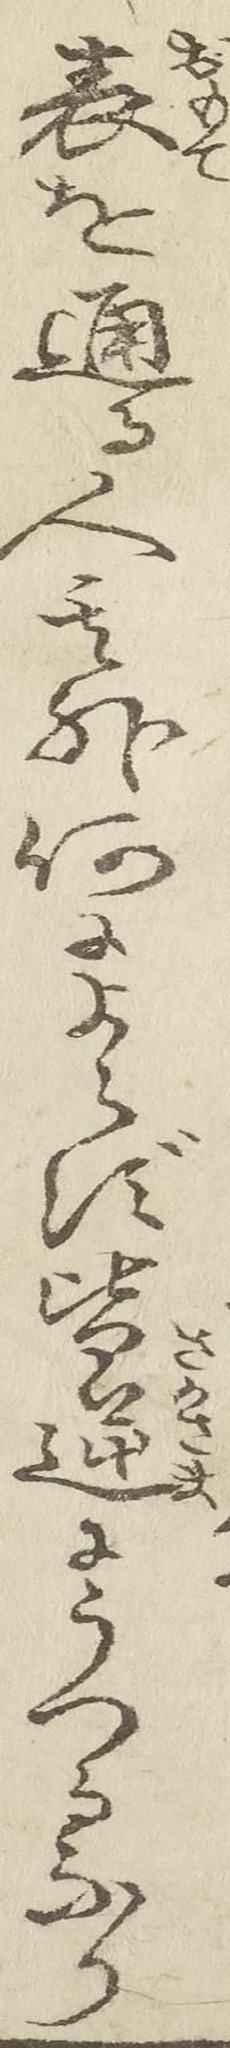表を通る人其外何によらず皆逆にうつるなり
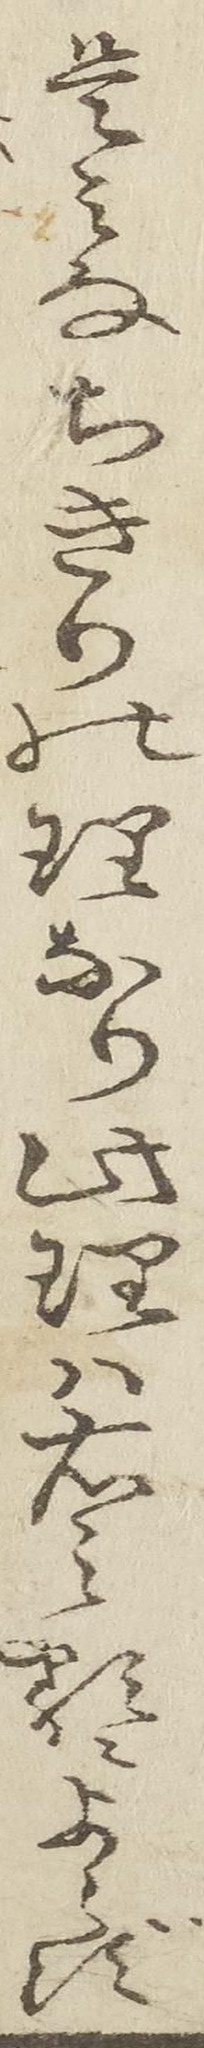是みなちきりの理なり此理は右之影ニよらず
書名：平天儀圖解
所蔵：東京大学地震研究所図書室 Earthquake Research Institute Library, The University of Tokyo, JAPAN
